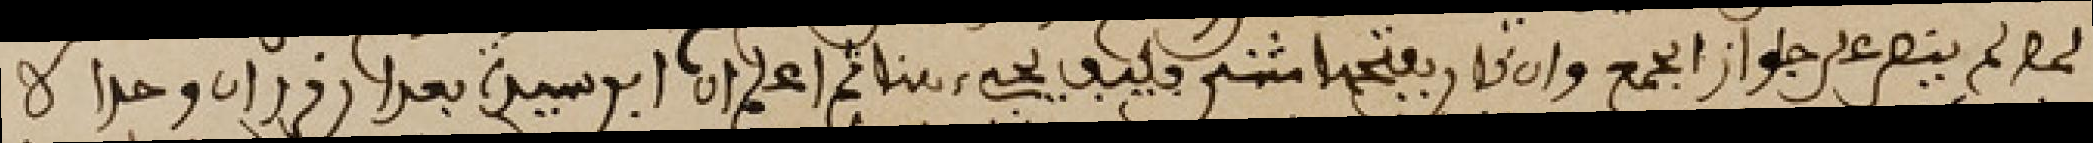لما لم ينصر على جواز الجمع و ان كان يفتحا مثنى بليس يحيي هنا ثم اعلم ان ابن سيد بعدا قرر ان وحدا لا
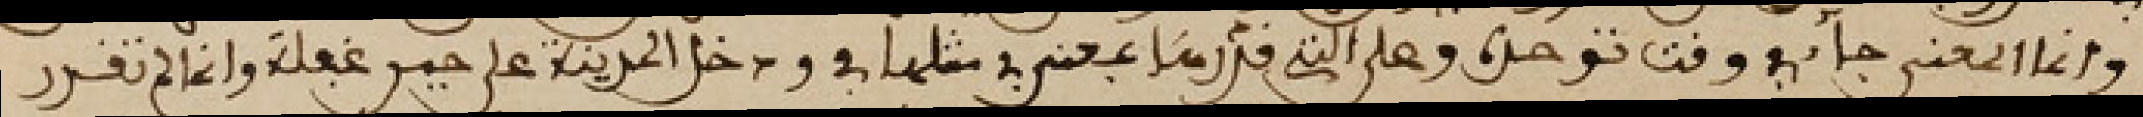وامنا المعنى جاء في وقت توحده و على التي قررها بمعنى في مثلها في دخل المدينه على حين غفلة و انما لم تقرر
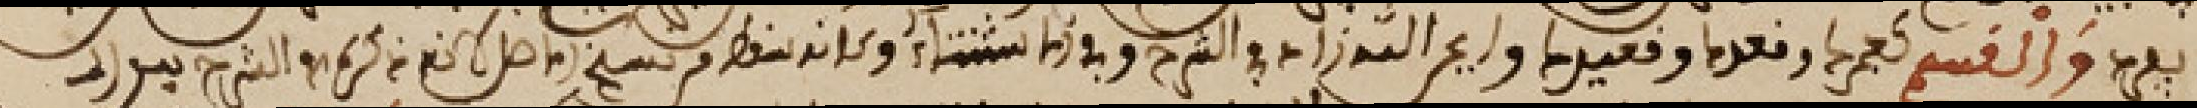يرد و القسم كعمرك و قعرك و قعيرك و اين التدارك في الشرح و في الاستثناء و كانه يسقط من نسخ الاصل كقول في ذكره مع الشرح يسر الى
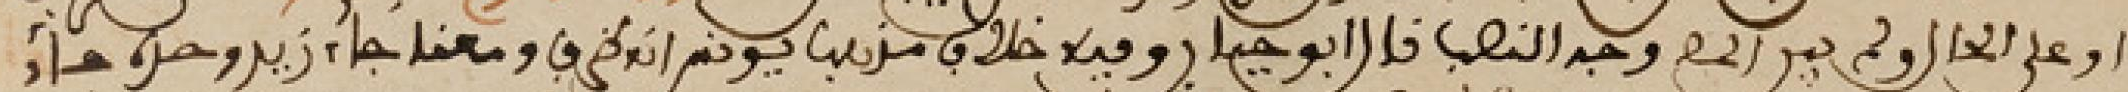او على الحال و لم يمر احمد على وجه النصب قال ابو حيان و فيه خلاف مذهب يونس انه ظرف و معناها جاء زيد وحده جاء
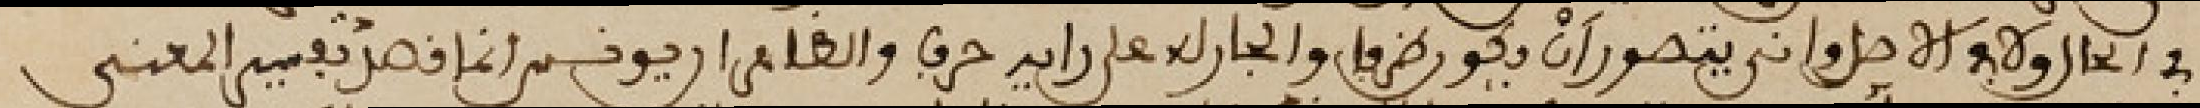فيالحال و لا الاصل و اني يتصور ان يكون ظرف و الجار له على زايد حرف و الظاهر ان يونس انما فضل تعبير المعنى
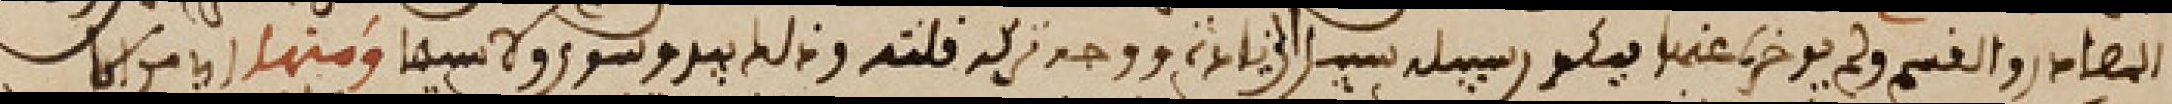المصادر و القسم و لم يدخره عنها فيكم في سبيله سبيل الزيادة ووجد تركه قلته و ذلك بيد و سؤال ولا سيما و منها ان من كان
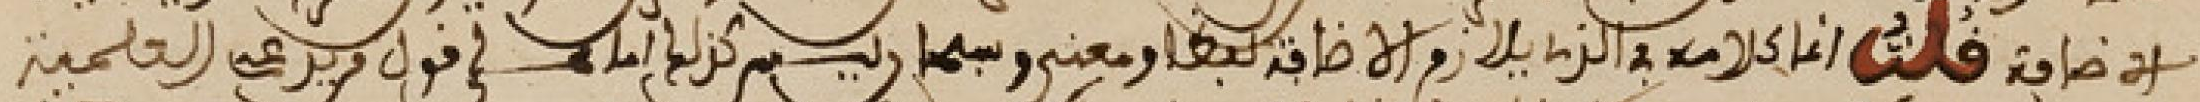الاضافة قلت ان كلامه في الزذا لازم الاضافة لفضا و معنى و سبحان ليس كذلك اما على قول من يدعى العلمية
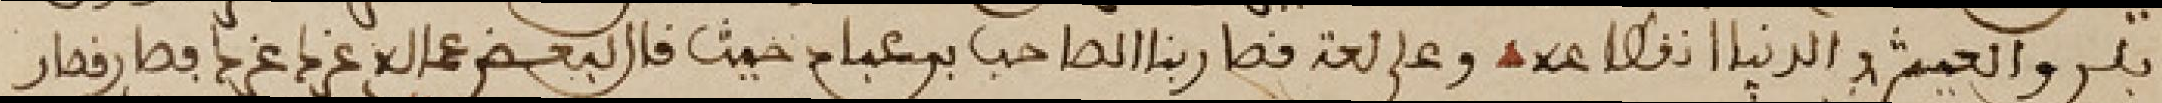بلى و العيش في الدنيا انفع عنده و على لغة فصار الصاحب بن عباد حيث قال لبعض عماله غرك فصار فصار
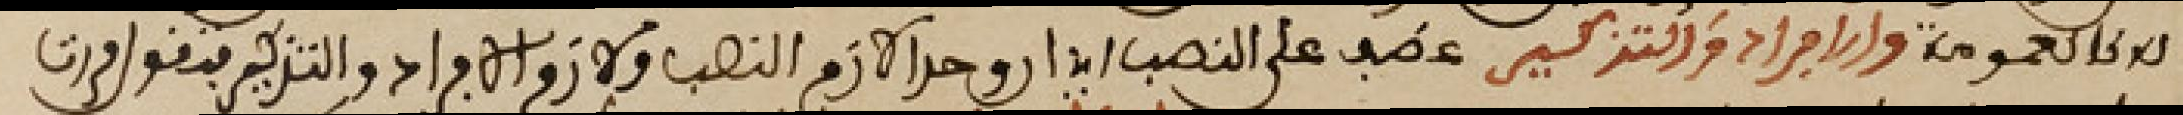له كالعمومة والاجراء و التذكير عطف على النصب اي اروحدا لازم النصب ولازم الاجراء و التذكير فتقول قررت
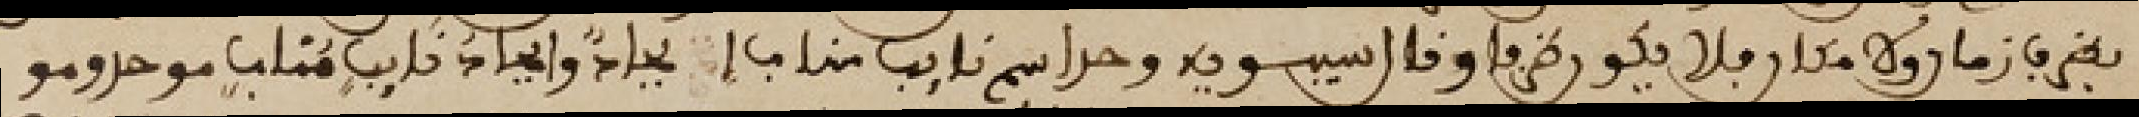بضرف زمان ولا مكان بلا يكون ركنها وقال سيبويه وجد اسم نايب مناب ايحاء و اعياد تايب كتاب موحد و مع
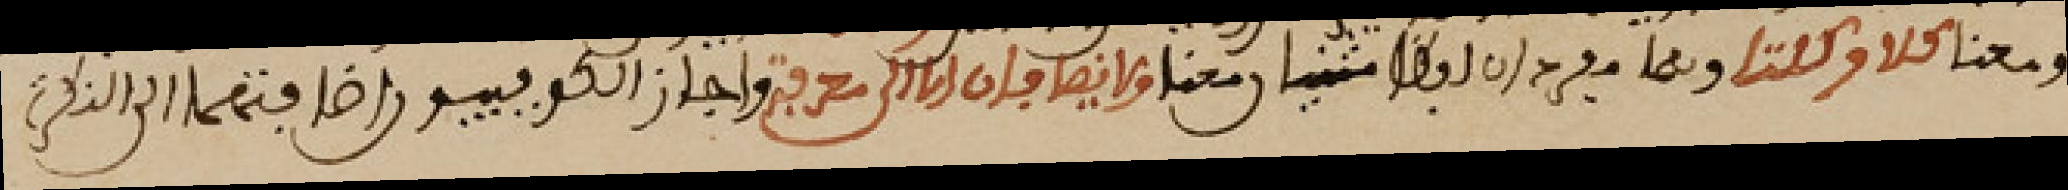و معنا كلا و كلتا و بهما مجرد ان لفظ مثنيان معنا و لايصاقان الى معرفة و اجاز الكوفيين راضا فتهم الى النكرة
